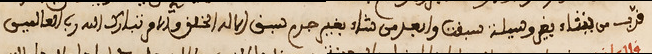قرب من شاء بغير وسيلة سبقت وابعد من شاء بغير جرم سبق الاله الخلق والامر تبارك الله رب العالمين
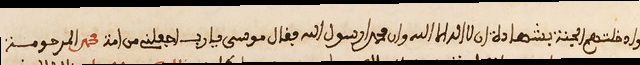ادخلتهم الجنة بشهادة ان لا اله الله وان محمدا رسول الله فقال موسى يا رب اجعلنى من امة محمد المرحومة
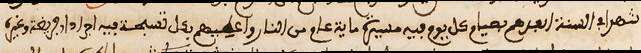شهرا في السنة ابعدهم بصيام كل يوم فيه مسيرة ماية عام من النار واعطيهم بكل تسبحة فيه اجر اداء فريضة وغيره
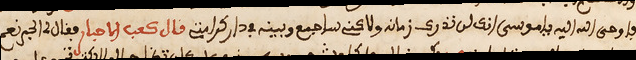فاوحى الله ايه يا موسى انك لن تدرك زمانه ولاكنى ساجمع وبينه في دار كرامتى قال كعب الاحبار فقال لى الحبر نعم
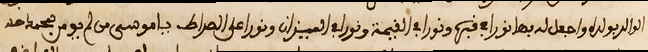الوالد بولده واجعل له بها نورا في قبره ونورا في القيمة ونورا في الميزان ونورا على الصراط يا موسى من لم يومن بمحمد #
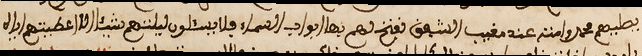يصليهم محمد وامته عند مغيب الشفق نفتح لهم بها ابواب السماء فلا يسئلون ليلتهم شيئا لا اعطيتهم اياه
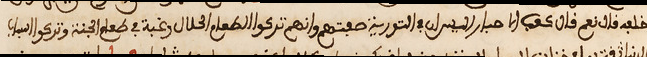خلفه قال نعم قال كعب الاحبار اليس ان في التورية صفتهم وانهم تركوا الطعام الحلال رغبة في طعام الجنة وتركوا اسباب
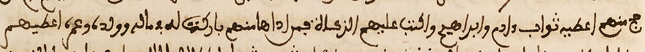حج منهم اعطيه ثواب ءادم وابراهيم واكتب عليهم الزكاة فمن اداها منهم باركت له في ماله وولده وعمره اعطيهم
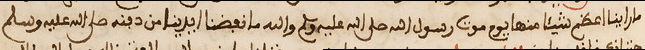ما راينا اعظم شيئا منها يوم موت رسول الله صلى الله عليه وسلم والله ما نفضنا ايدينا من دفنه صلى الله عليه وسلم
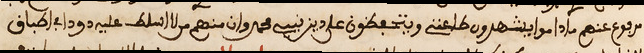موفوع عنهم ما داموا يشهدون طاعتى ويتحفظون على دين نبيى محمد وان منهم من لا اسلط عليه دودا في اطباق
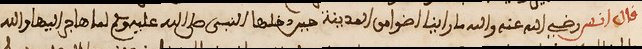قال انس رضي الله عنه والله ما راينا اضوا من المدينة حين دخلها النبى صلى الله عليه وسلم لما هاجر اليها والله
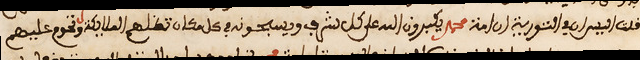قلت اليس ان في التورية ان امة محمد يكبرون الله على كل شرف ويسحبونه في كل مكان تظلهم الملايكة وتحوم عليهم
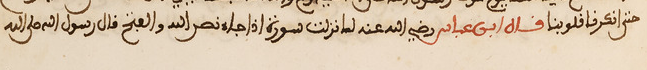حتى انكرنا قلوبنا قال ابن عباس رصي الله عنه لما نزلت سورة اذا جاء نصر الله والفتح قال رسول الله صلى الله
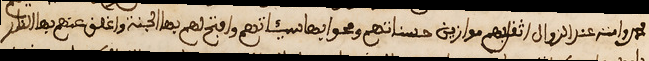محمد وامته عند الزوال اثقل بهم موازين حسناتهم ومحوا بها سيئاتهم وافتح لهم بها الجنة واغلق عنهم بها النار
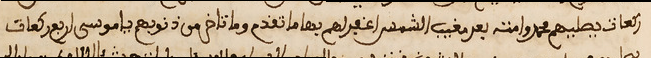ركعات يصليهم محمد وامته بعد مغيب الشمس اغفر لهم بها ما تقدم وما تاخر من ذنوبهم با موسى اربع ركعات
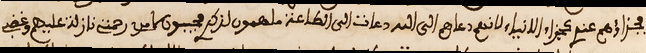فجزاؤهم عنى كجزاء الانياء لانهم دعاهم الى الله دعات الى الطاعة ملهمون لذكرى مجيبون لامرى رحمتى نازلة عليهم وغضبى
